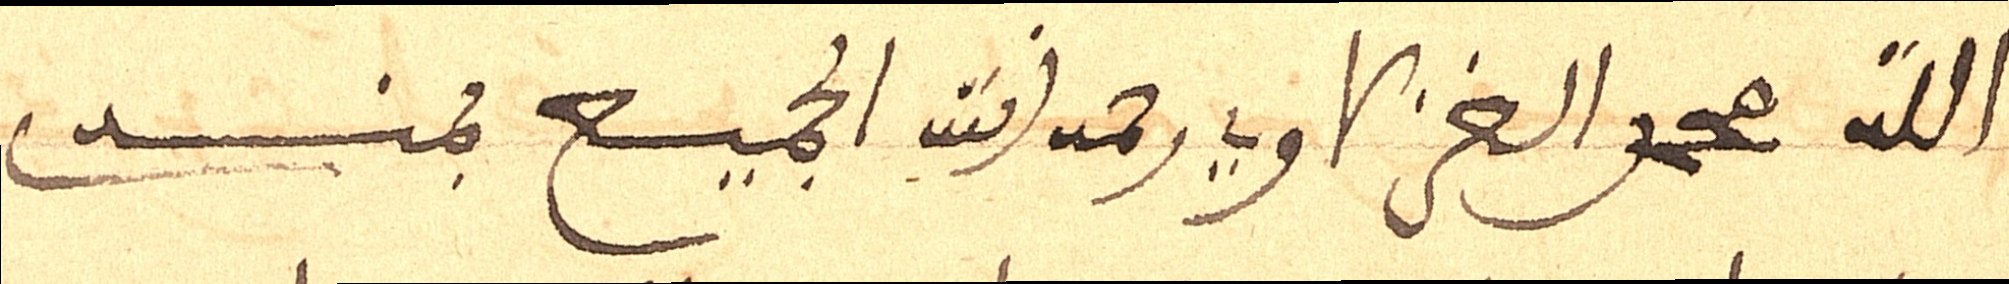الله محمد الغز لاوي رحمه الله الجميع بمندى
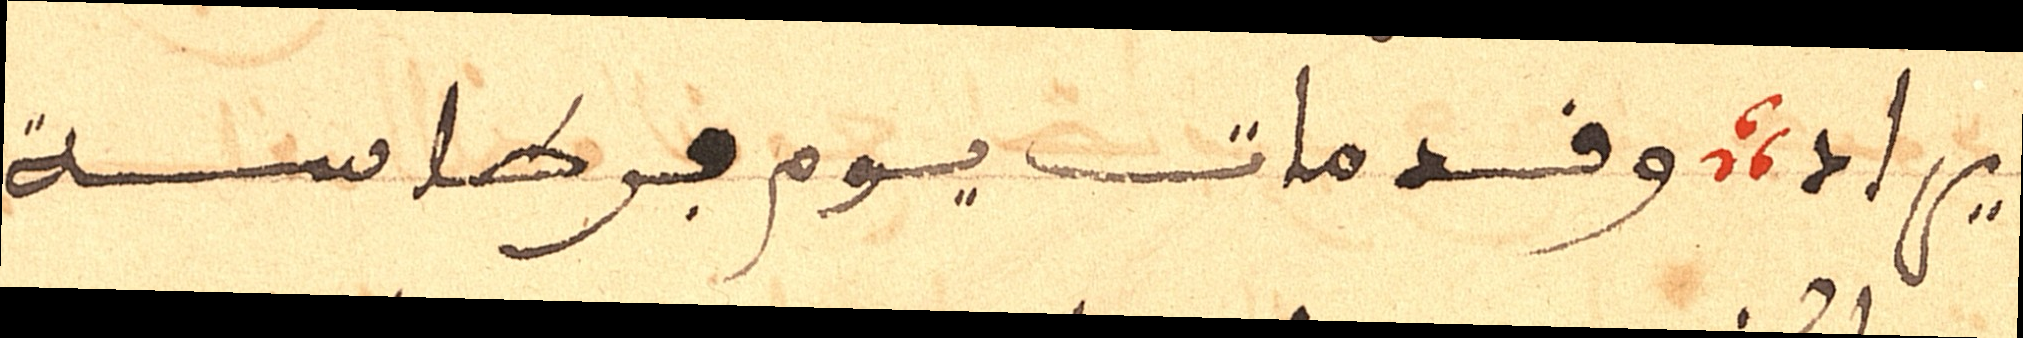يراد وقد مات يوم فرطاسة
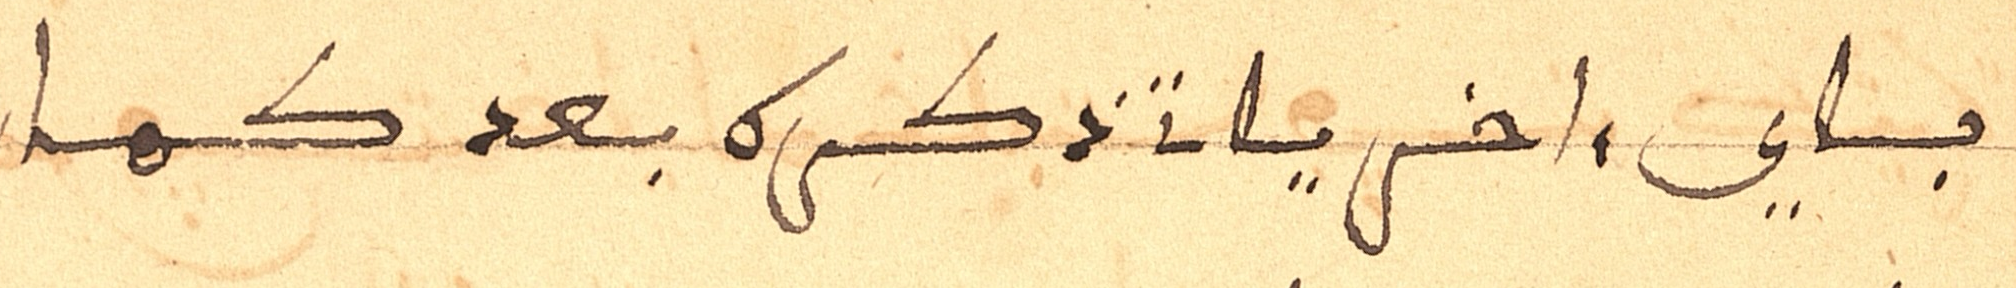باي ءاخر ياتى ذكره بعد كما
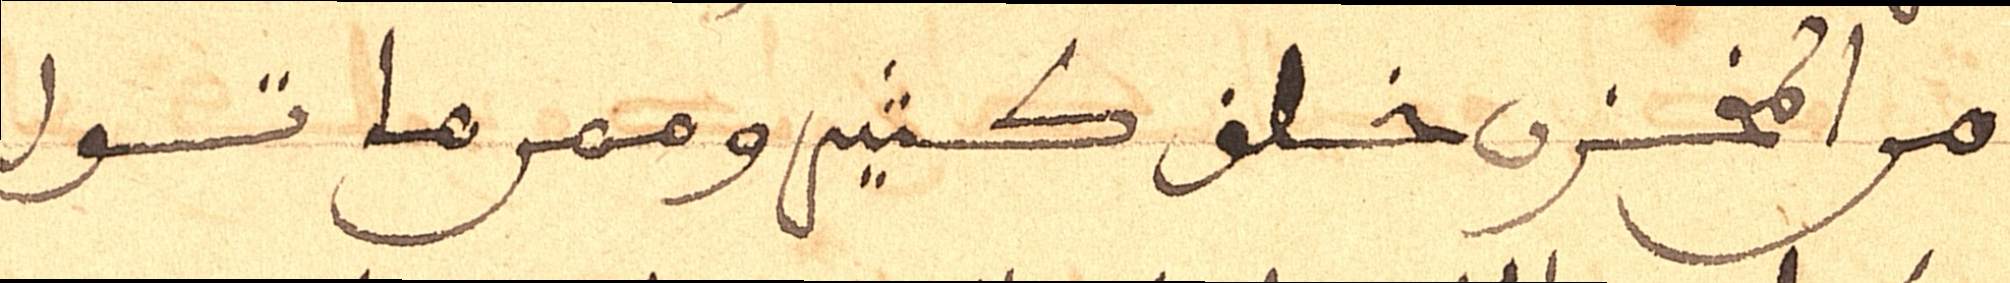من المخزن خلق كثير وممن ما تول
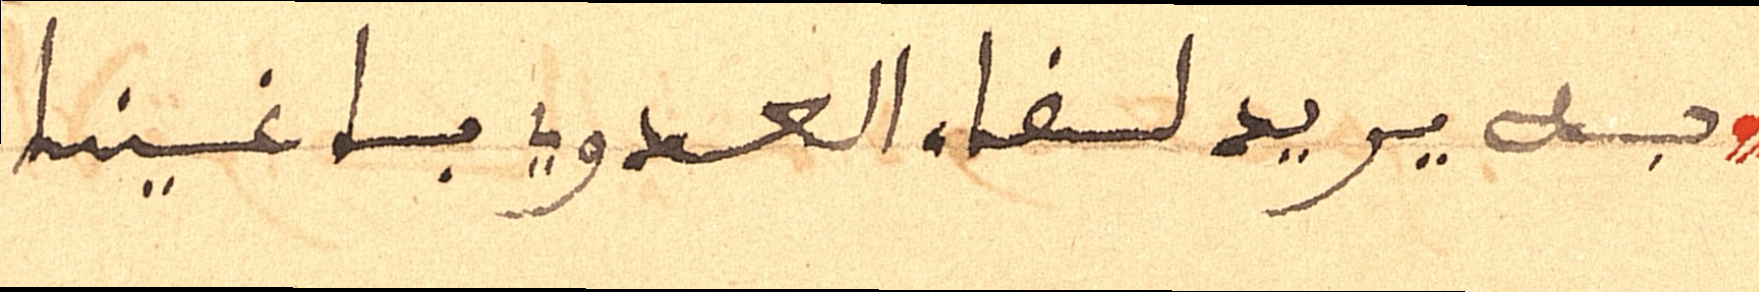به يريد لقاء العدوي باغينا
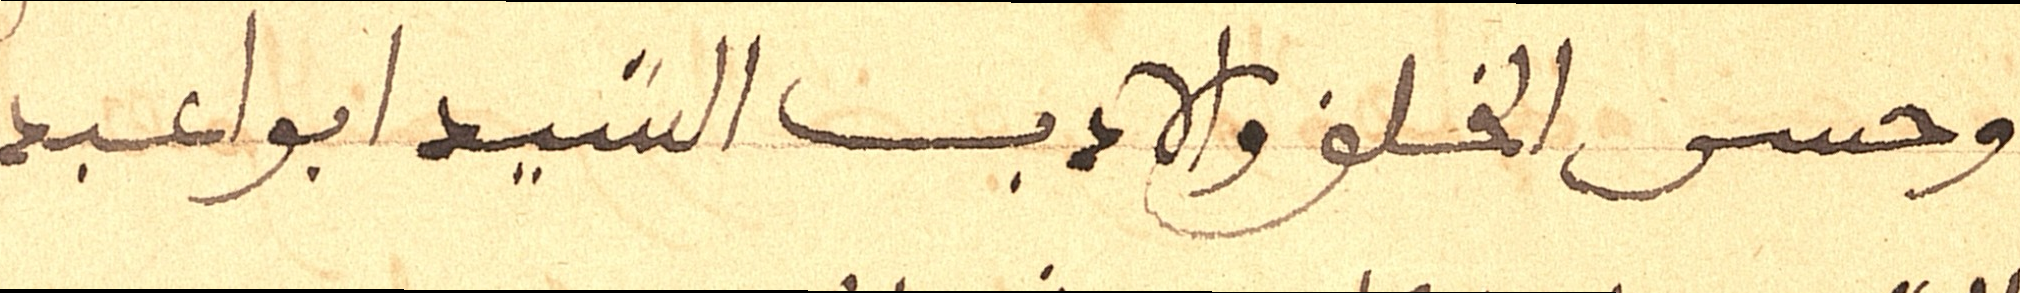وحسن الخلق والادب السيد ابوا عبد
